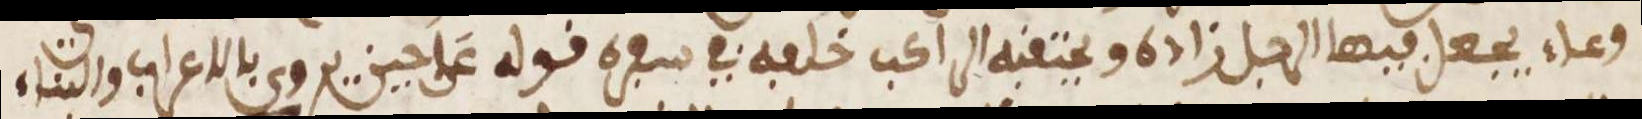وعاء يجعل فيها الرجل زاده و يحتقبه الراكب خلفه في سفره قوله على حين يروى بالاعراب و البناء
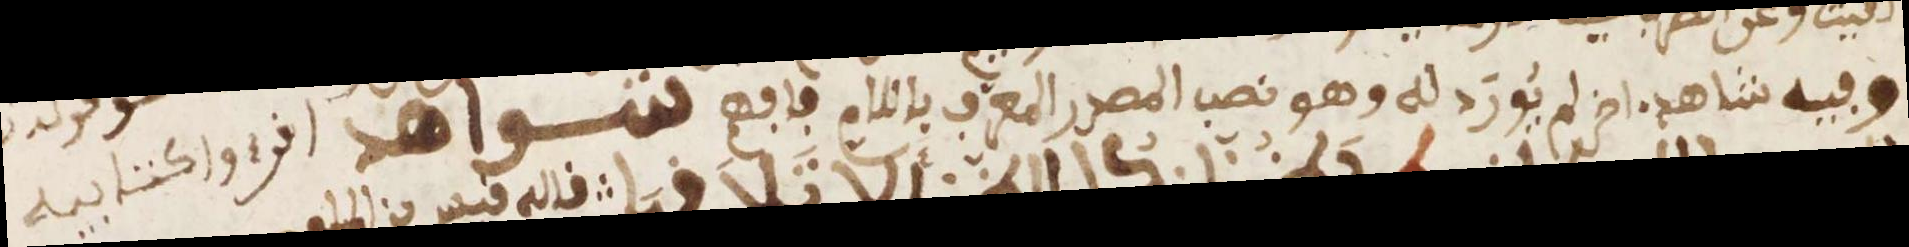و فيه شاهد اخر لم يورد له و هو نصب المصدر المعرف باللام فافهم شواهد
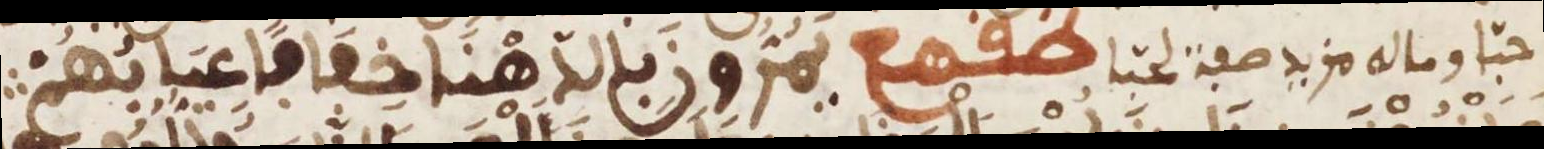حبا و ماله مزيد صفة لحبا ظقهع يمرون بالدهنا خفافا عيابهم
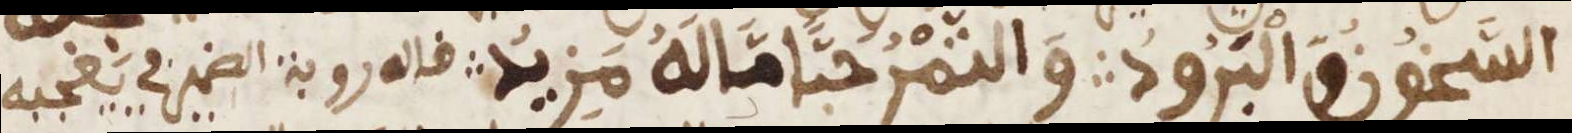السخون و البرود و التمر حبا ماله مزيد قاله روبة الضمير في يعجبه
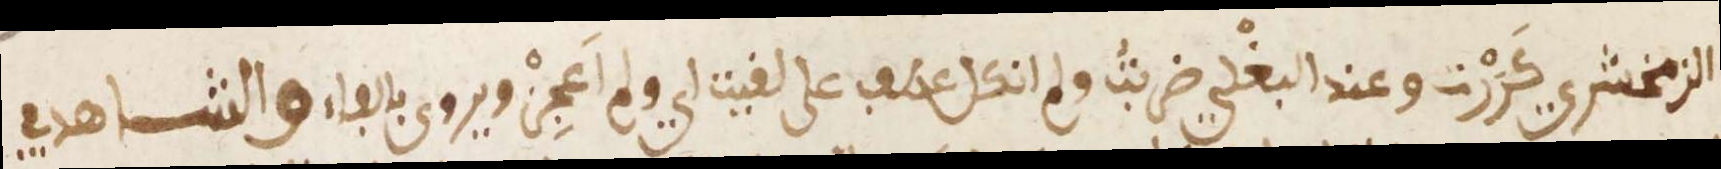الزمخشري كررت و عند البغلي ضربت و لم انكل عطف على لقيت اي و لم اعجز و يروى بالفاء و الشاهد في
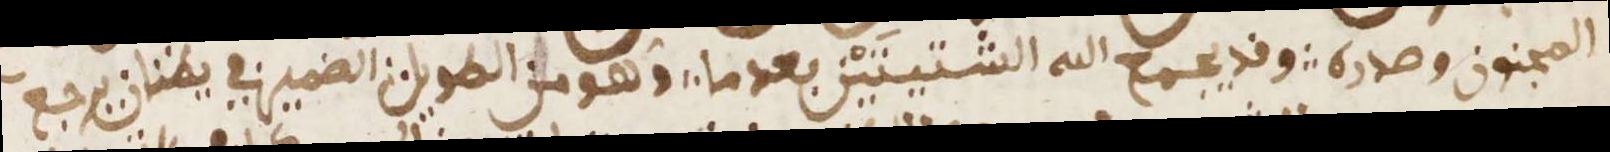المجنون و صدره و قد يجمع الله الشتيتين بعدما و هو من الطويل الضمير في يظنان يرجع
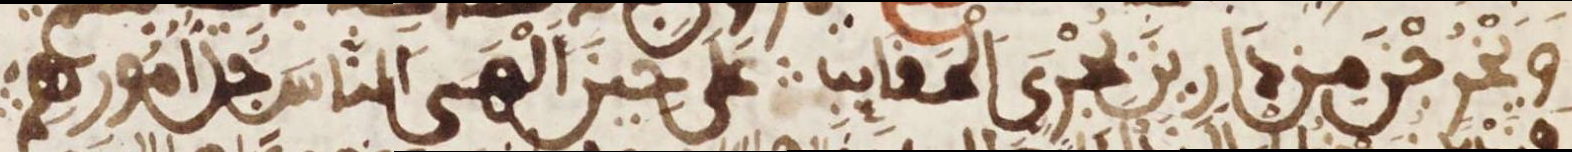و يخرجن من دارين بجرى الحقائب على حين ألهى الناس جل امورهم
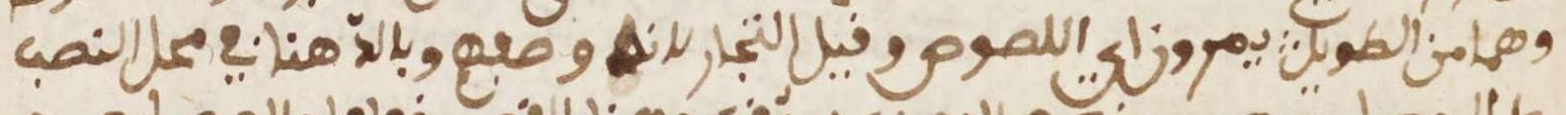وهما من الطويل يمرون اي اللصوص و قيل التجار لانه وصفهم بالدهنا في محل نصب
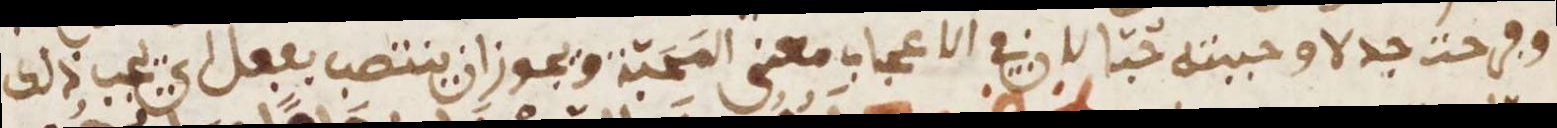و فرحت جدلا و حببته حبا لان في الاعجاب معنى المحبة و يجوز ان ينتصب بفعل اي يجب ذلك
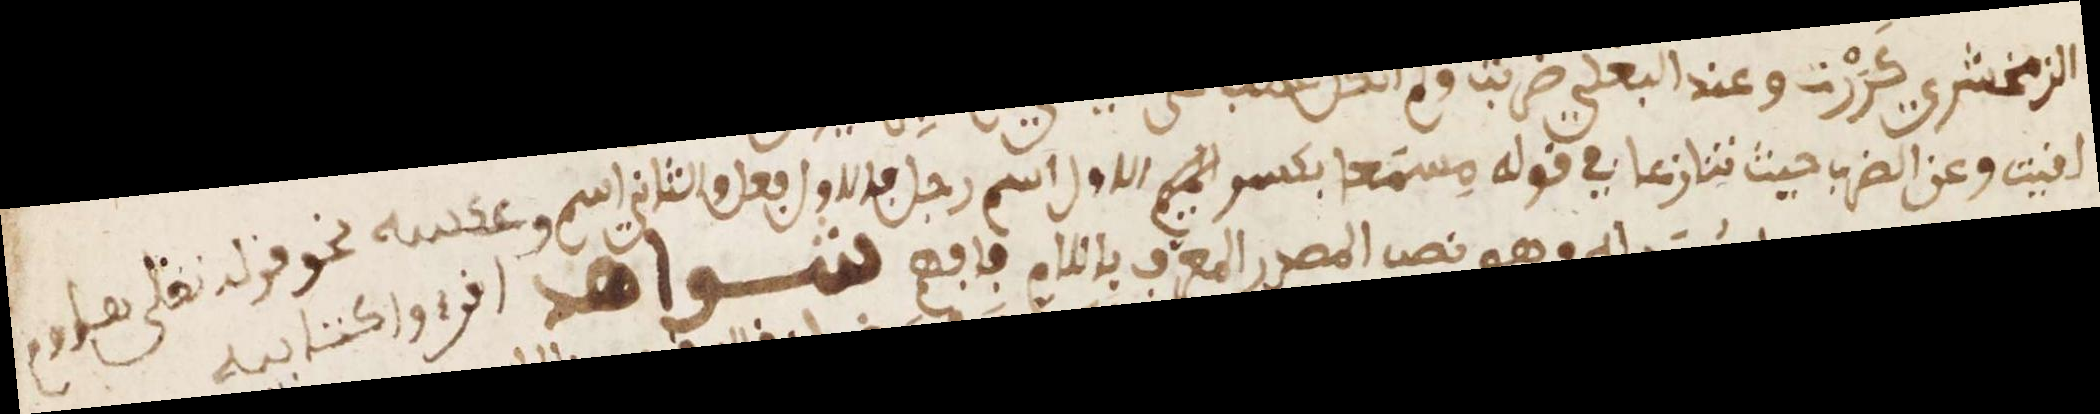لقيت و عن الضرب حيث تنازعا في قوله مسمعا بكسر الاول اسم رجل فالاول فعل و الثاني اسم
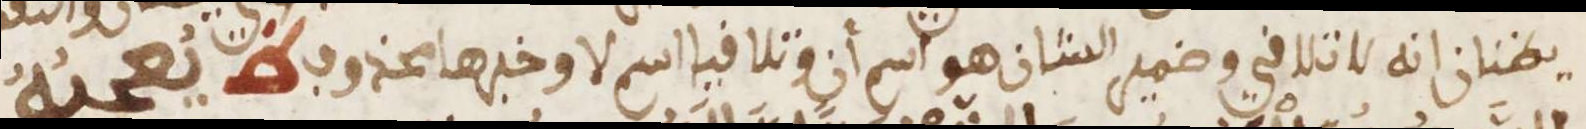يظنان انه لا تلاقي و ضمير الشان هو اسم أن و تلاقيا اسم لا و خبرها محذوف ظ يعجبه
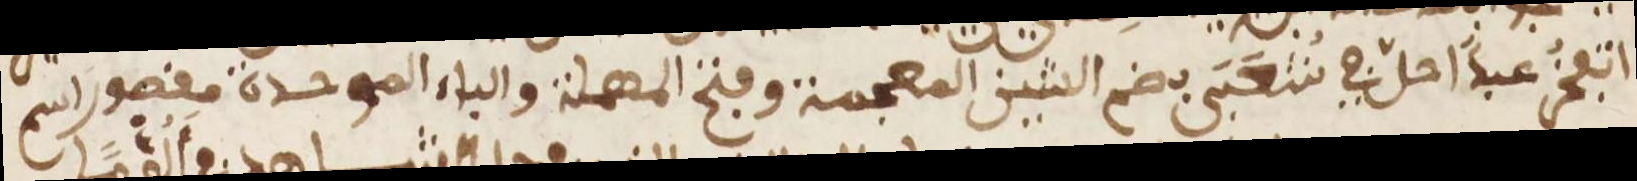اتفخر عبدا حل في شعبى بضم الشين المعجمة و فتح المهملة و الباء الموحدة مقصور اسم
